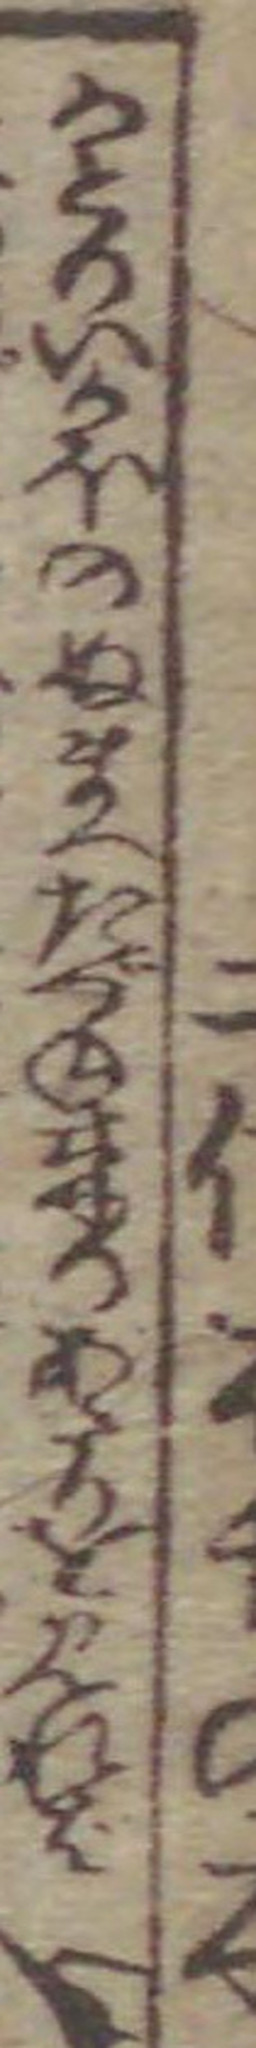かとりいかほのぬまへたづね来りあたりを見れば
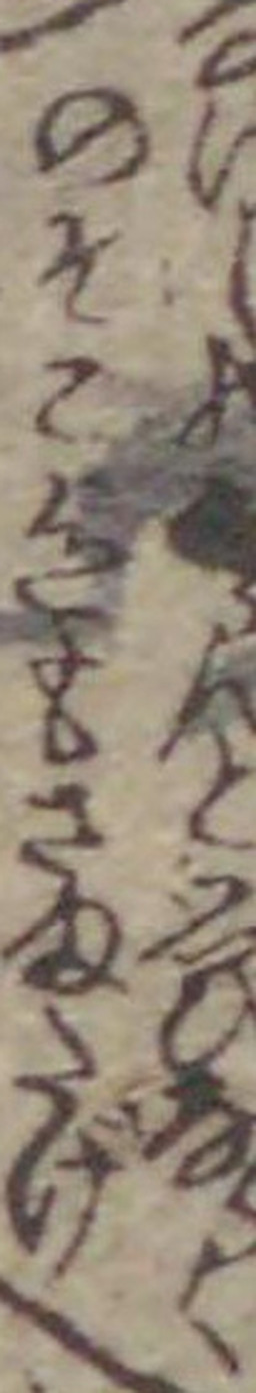のそこ迄もさまたげ
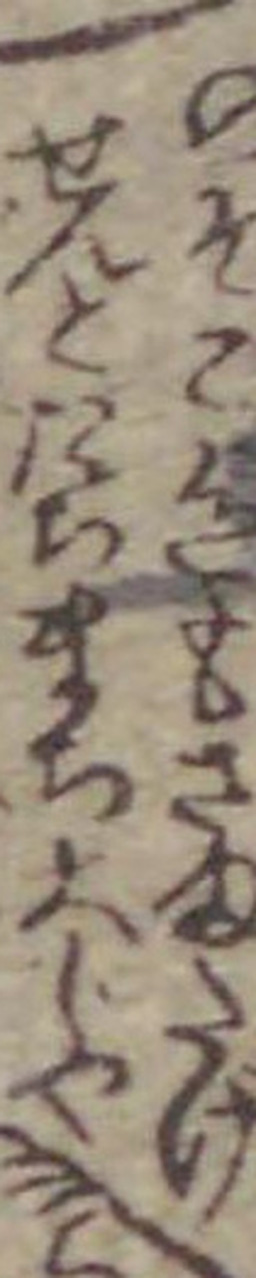せんとたちまち大じや
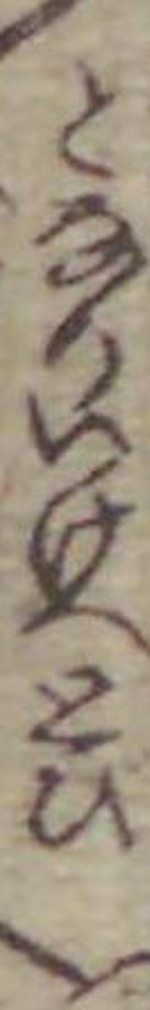となりいけへとび
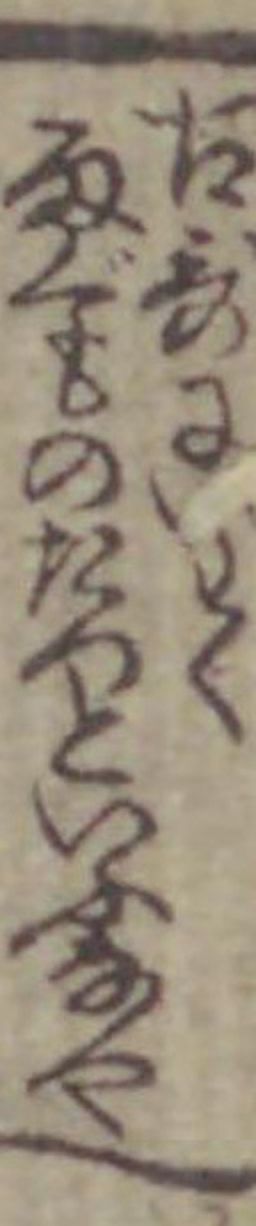雨ぐものたつといふなや
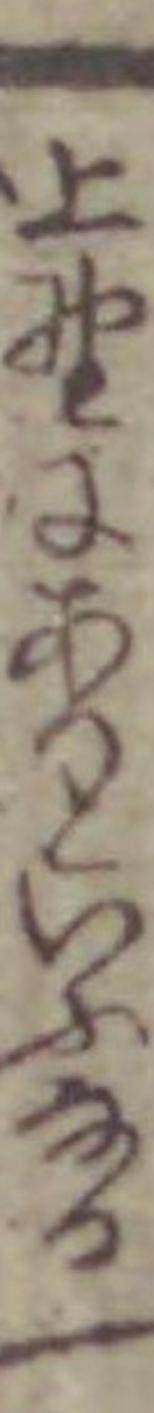上野にありといふなる
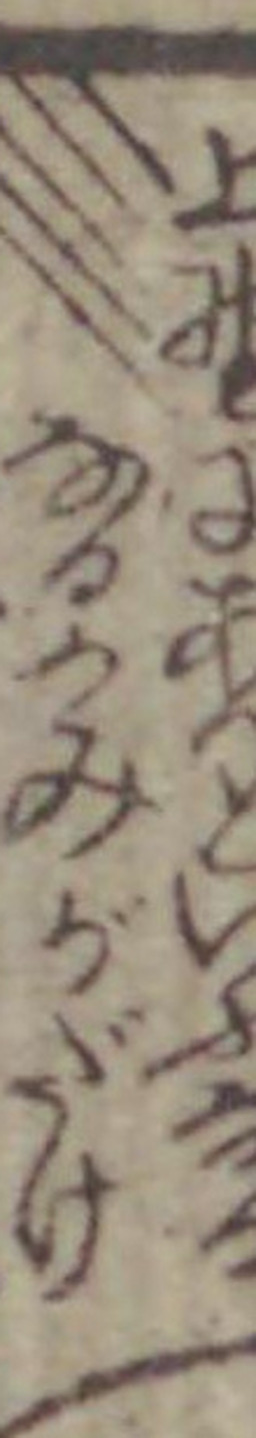なるうみがだけ

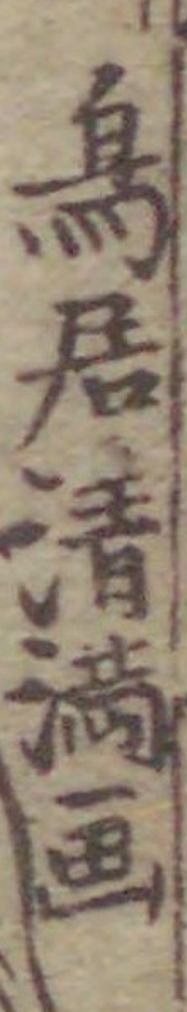鳥居清満画
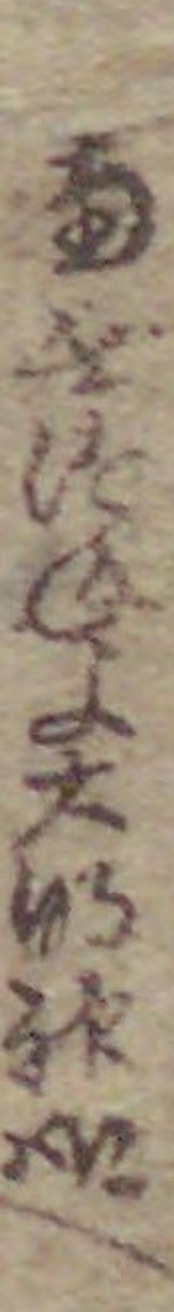南無つねよ大明神様
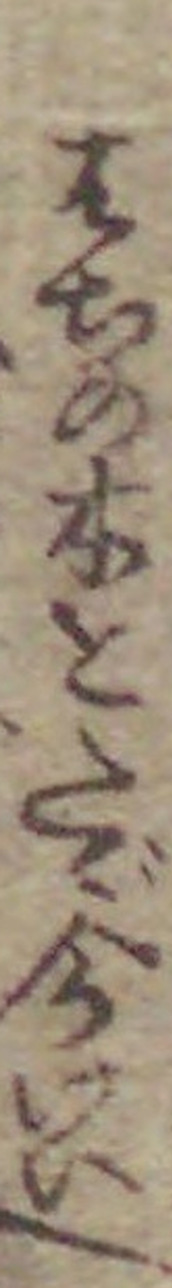はちの木をたゞ今けい
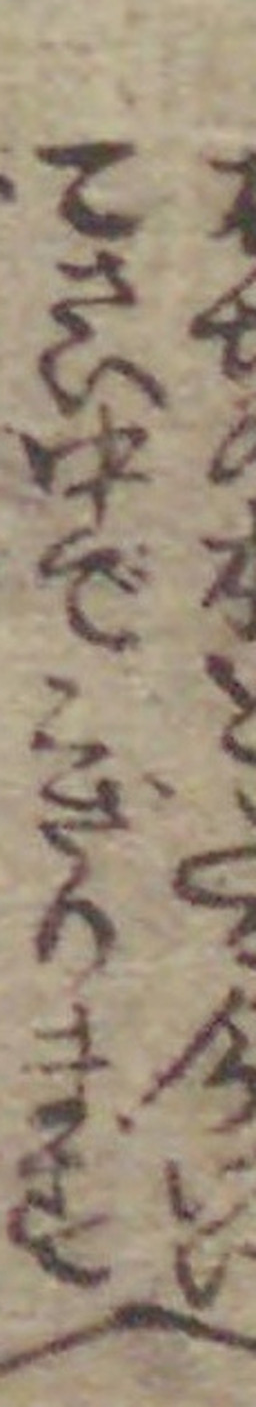こさい中でこざります
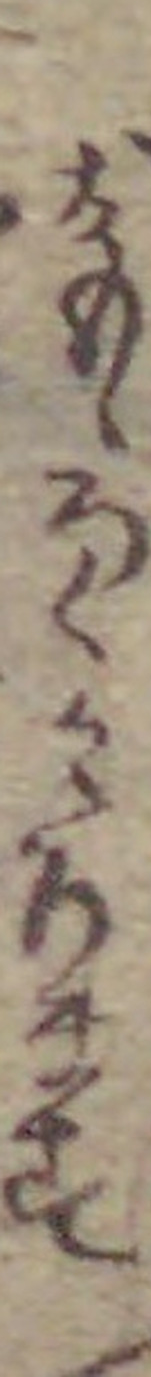おもしろくかたります
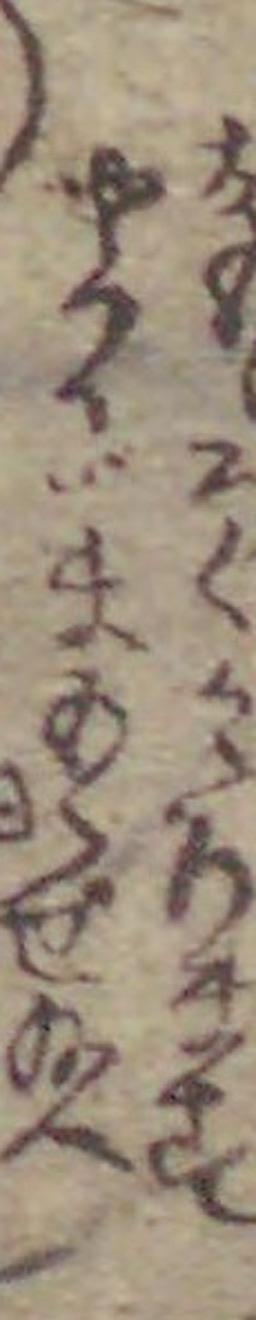やうにまもらせ給へ
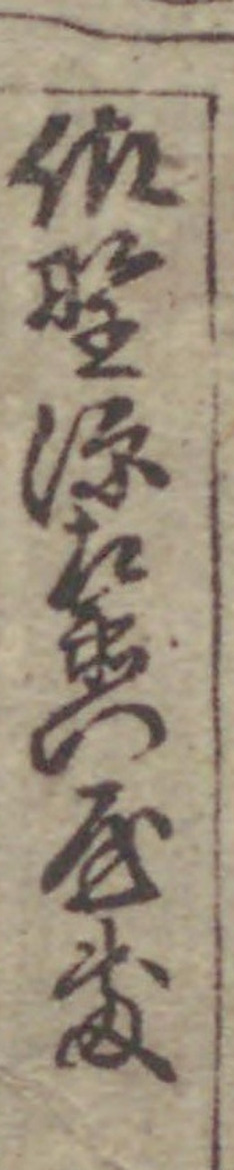佐野源左衛門屋敷
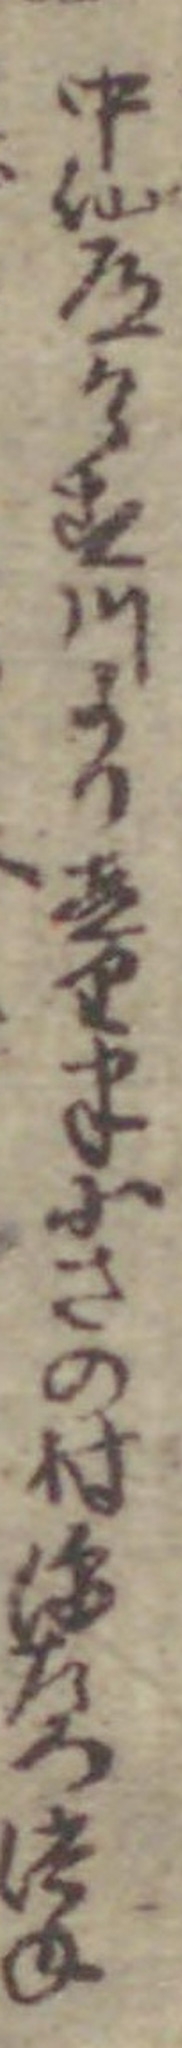中仙道から直川より壹里半にさの村源左衛門つね
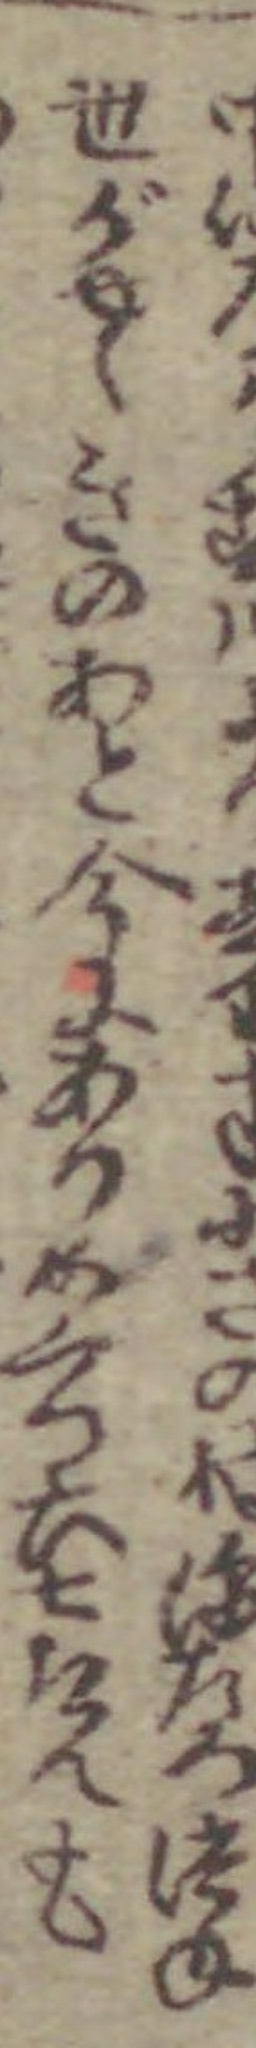世がやしきのあと今にありめくり六七けんも
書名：娜二代鉢木 5巻
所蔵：国立国会図書館 National Diet Library, JAPAN
